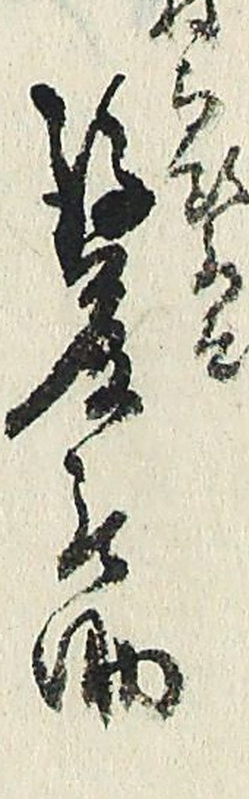後藤庄助
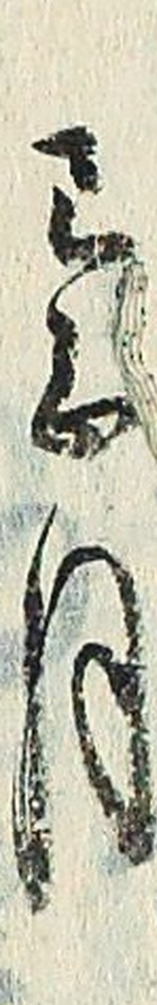巳正月
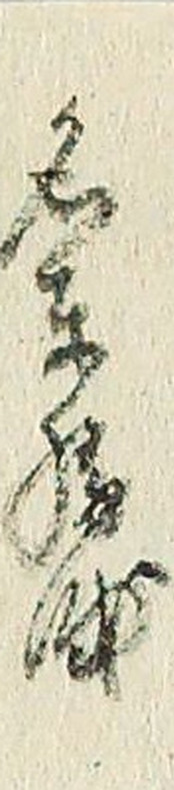名東勝浦
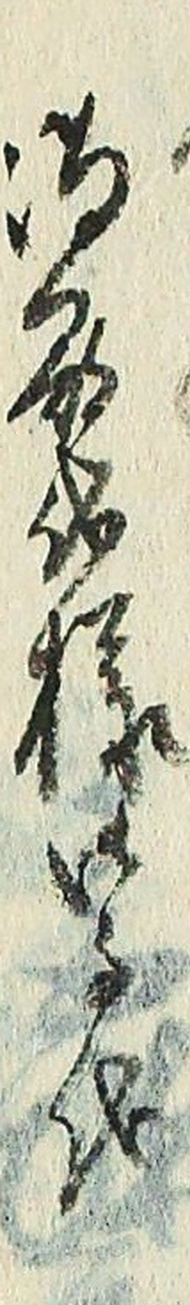御郡代様御手代
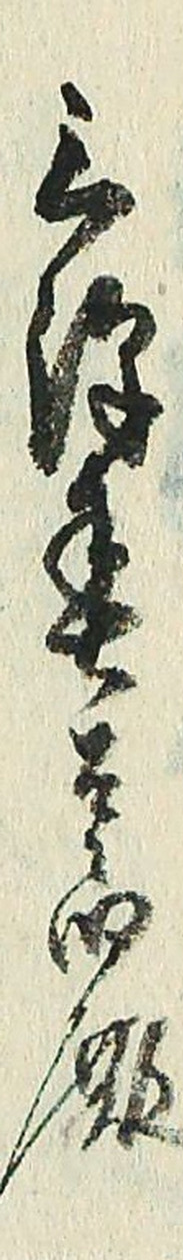三沢春太郎殿
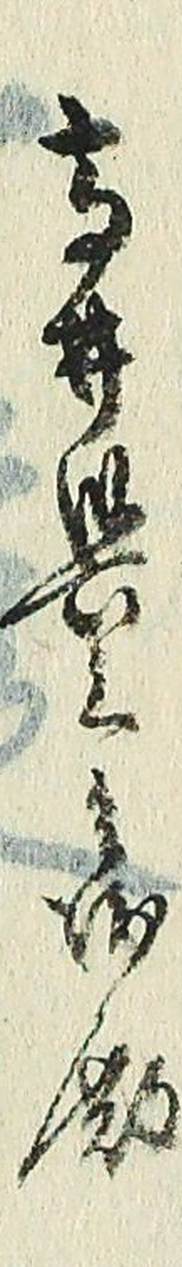高井与三兵衛殿
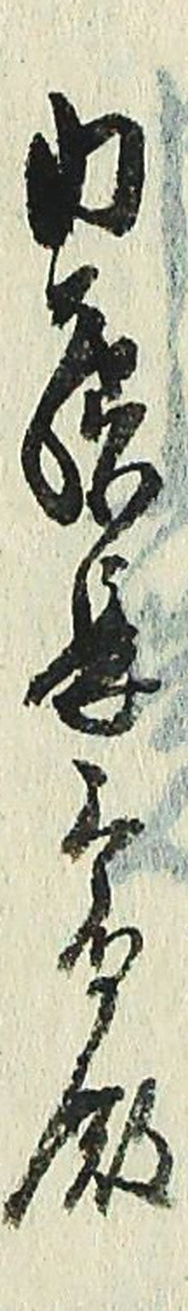内藤長三郎殿
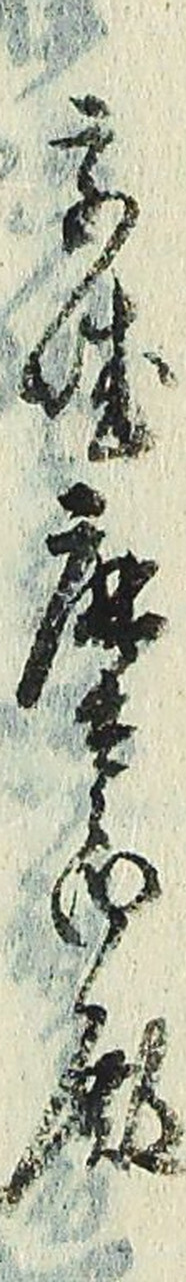宮城麻太郎殿
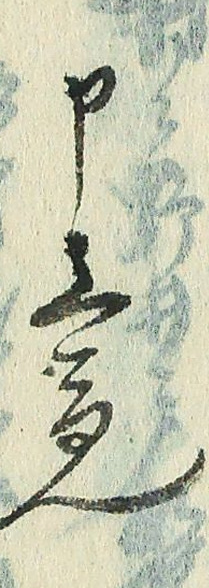申上覚
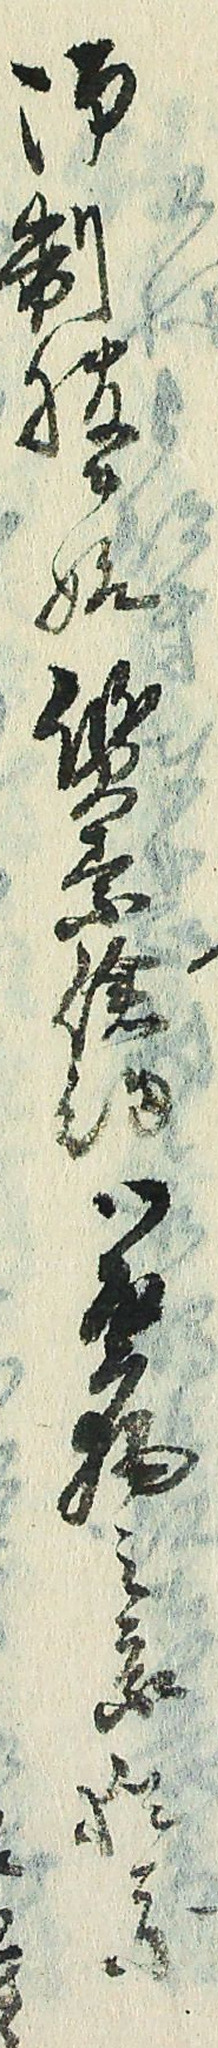御制服を始質素倹約御発揚之義猶亦
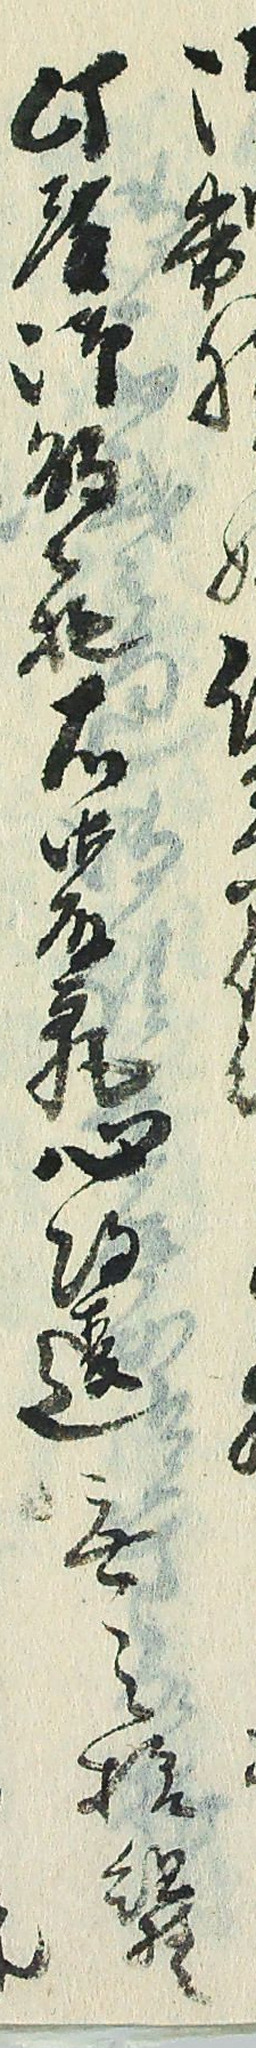此度御触被遊右御取究心得違無之様組村々
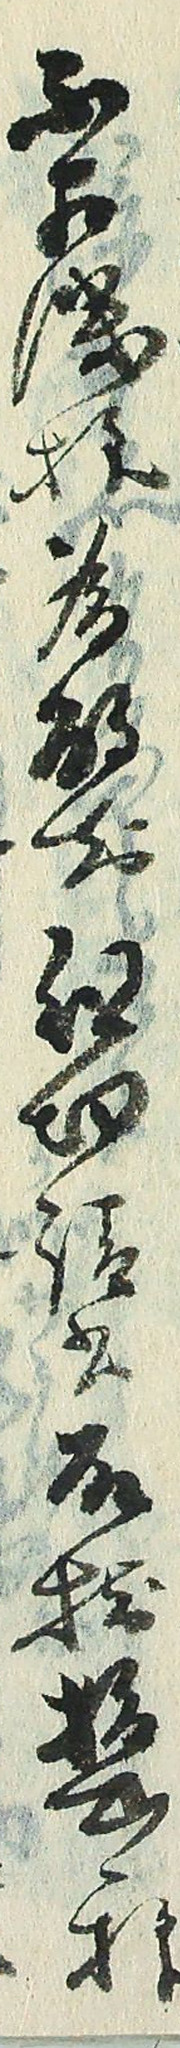不相洩様為触知組切請書取揃指出候様
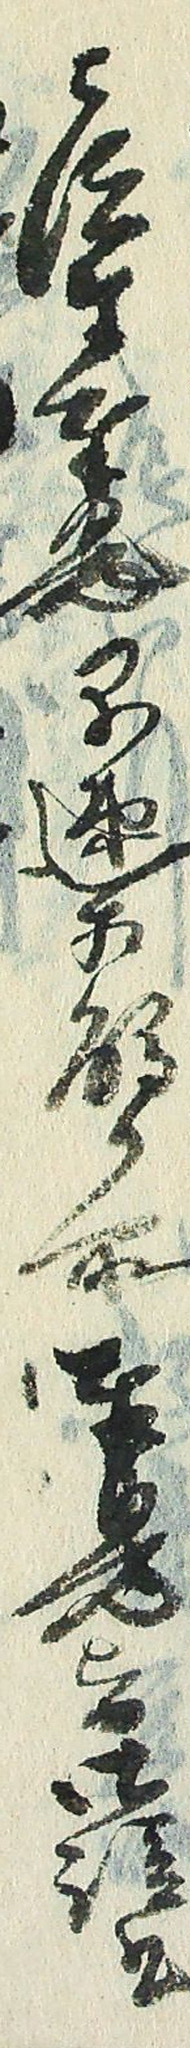被仰付奉畏早速相触候所奉畏旨御請書
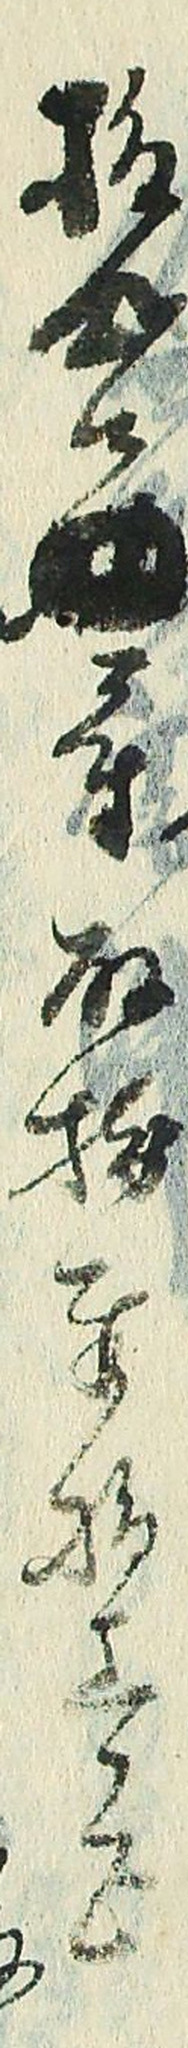指出候に付取揃奉指上候以上
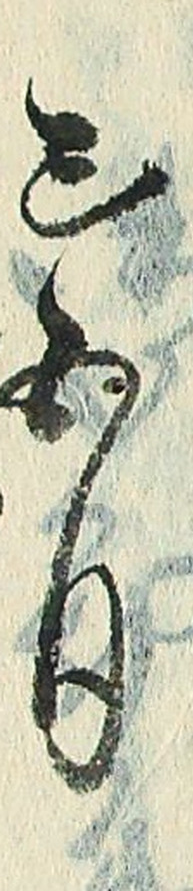巳五月
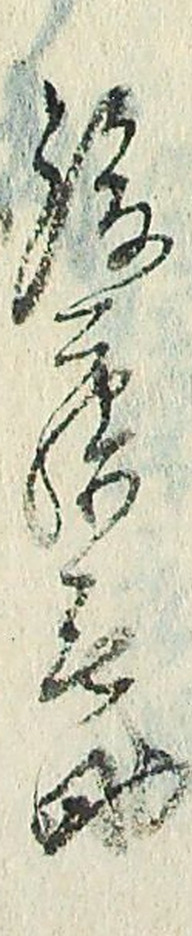後藤庄助
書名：諸御用御□受書控
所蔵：鳴門教育大学 Naruto University of Education
